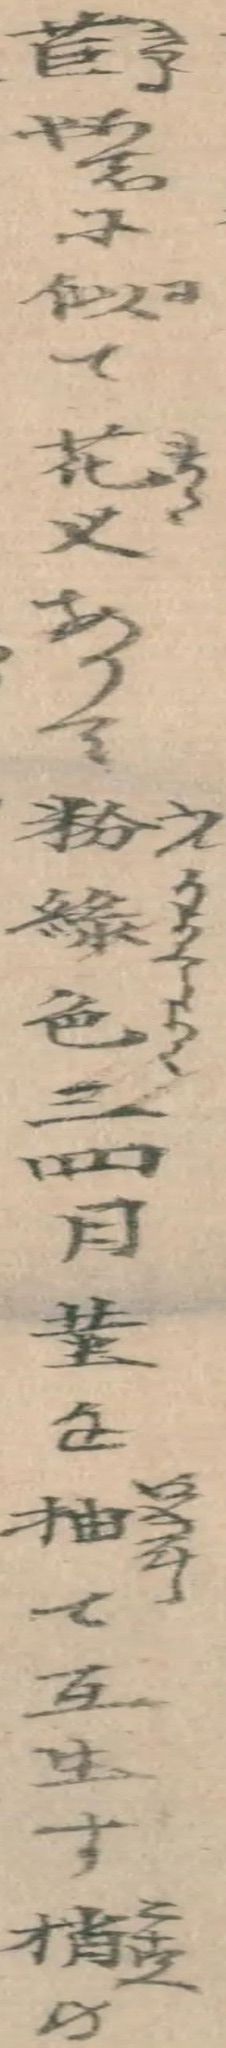苣ちしやに似て花叉ありて粉緑色三四月茎を抽て互生す梢の
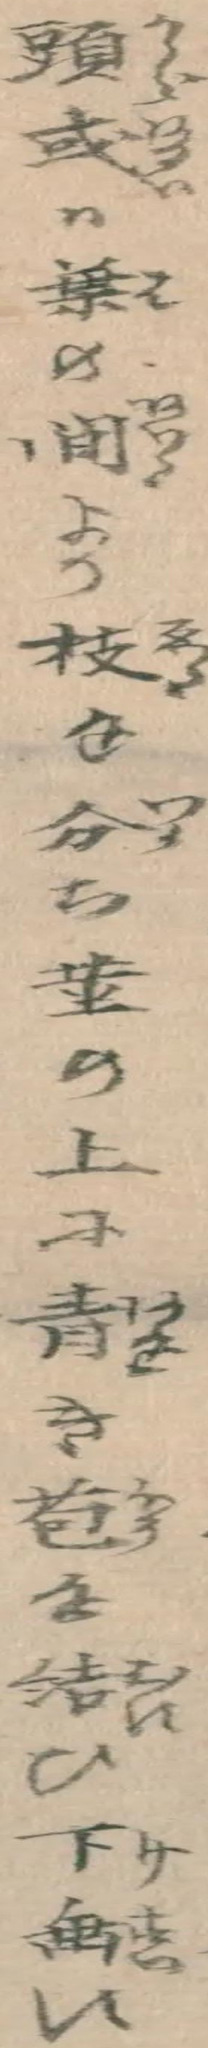頭或は葉の間より枝を分ち茎の上に青き苞を結ひ下垂す
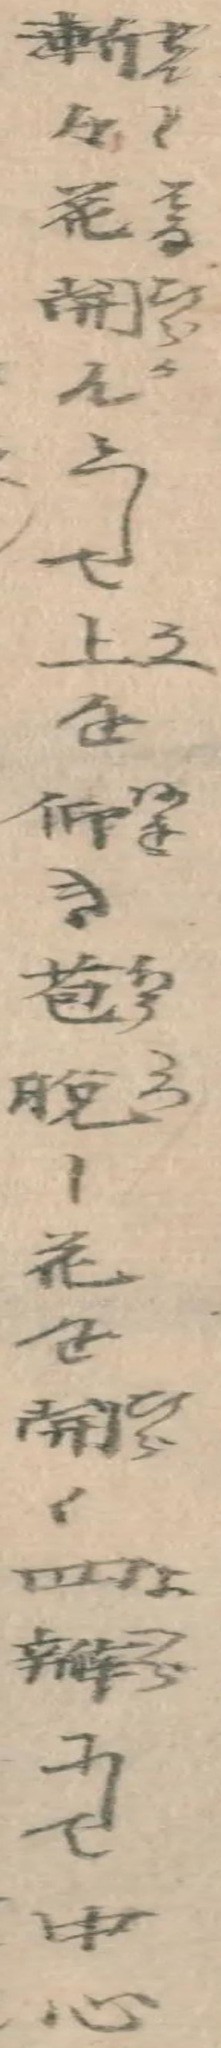漸々花開んとして上を仰き苞脱し花を開く四弁にして中心
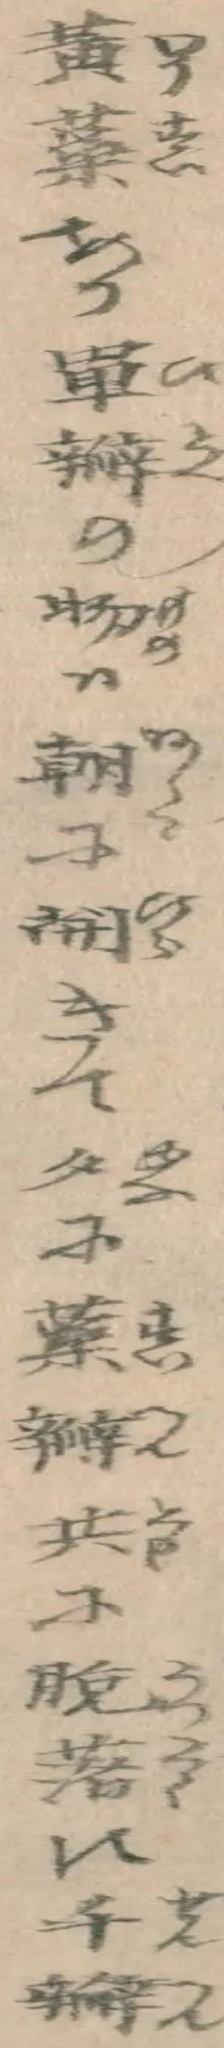黄蕊あり単弁の物は朝に開きて夕に蕊弁共に脱落す千弁
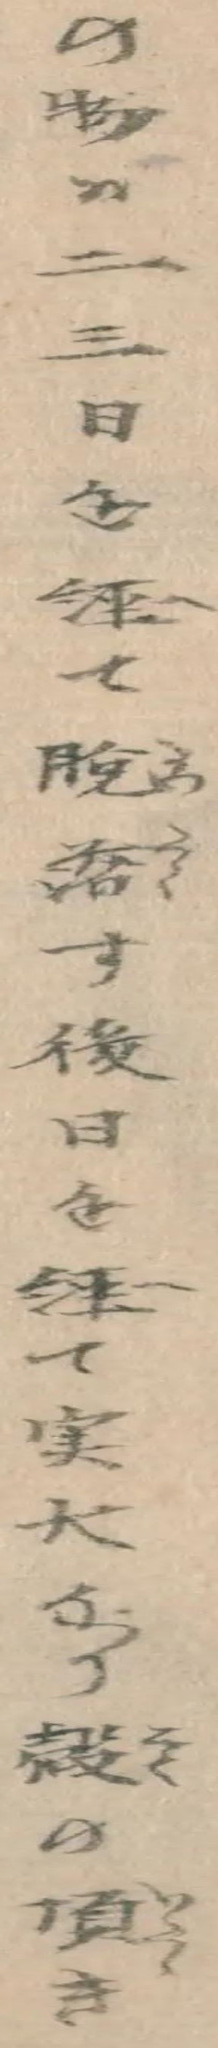の物は二三日を経て脱落す後日を経て実大なり殻の頂き
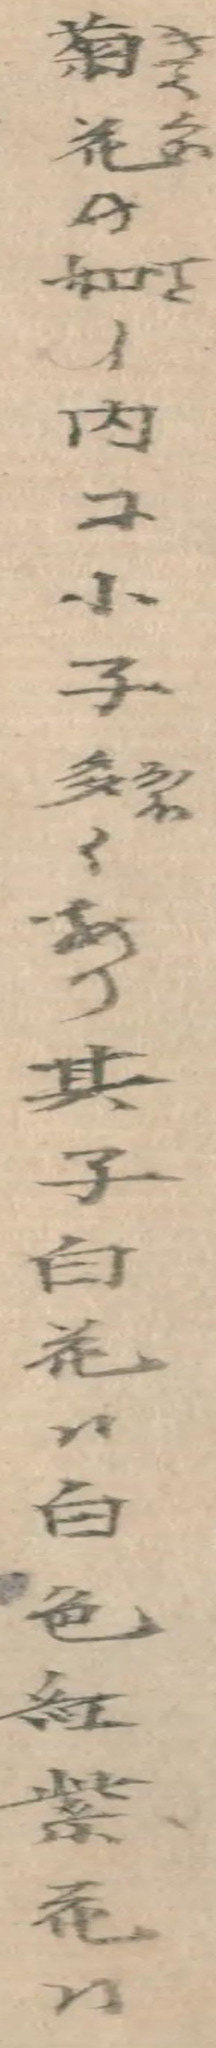菊花の如し内に小子多くあり其子白花は白色紅紫花は
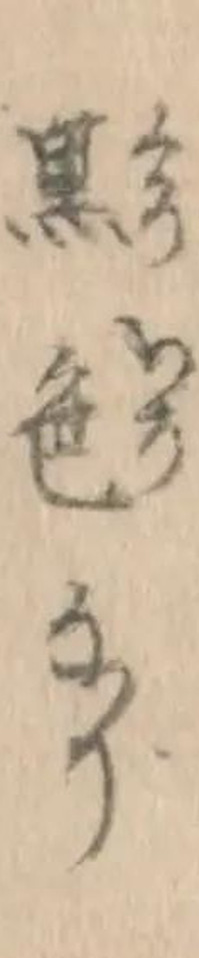黒色なり

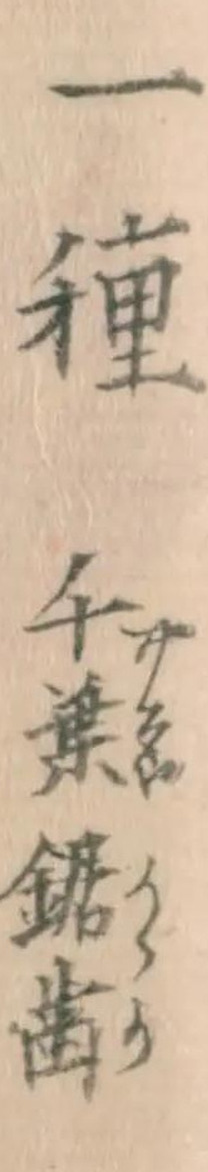一種千葉鋸歯
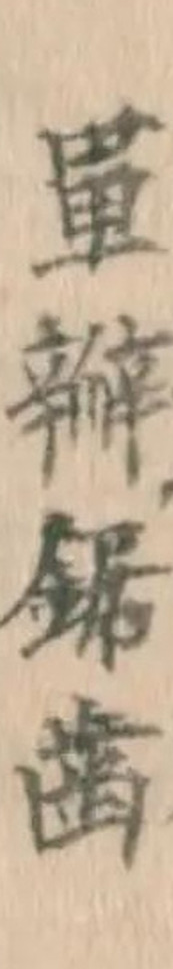単弁鋸歯
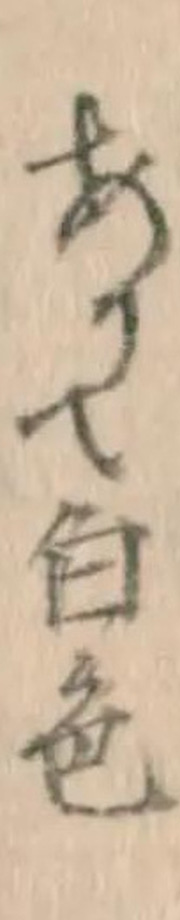ありて白色
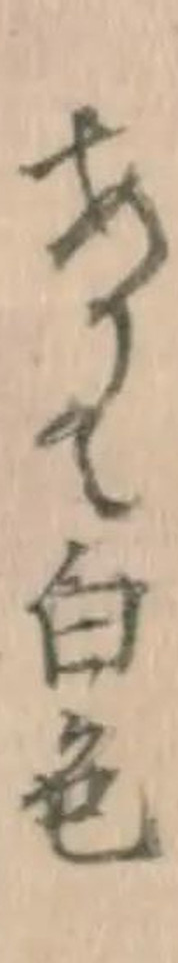ありて白色
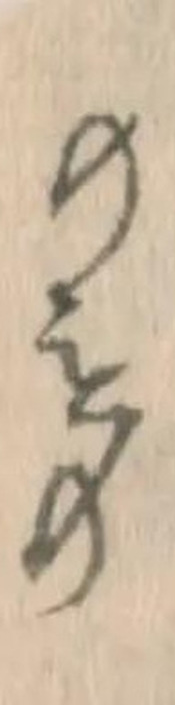のもの
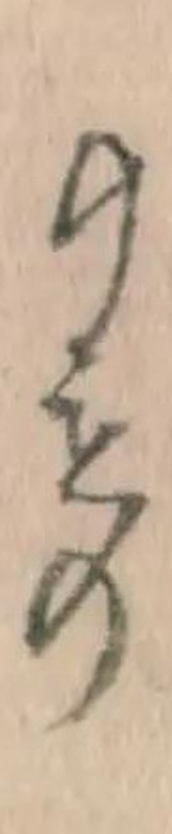のもの

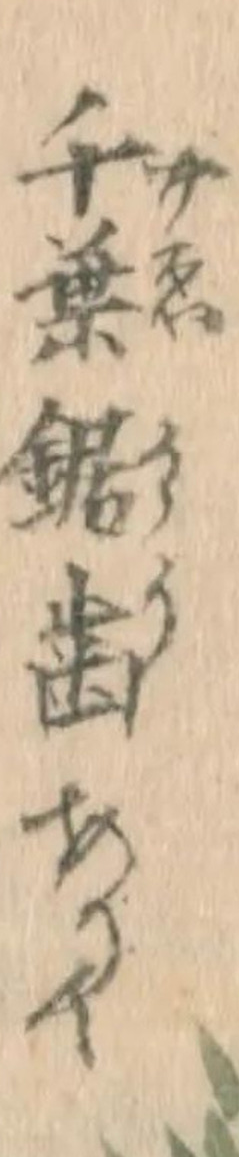千葉鋸歯ありて
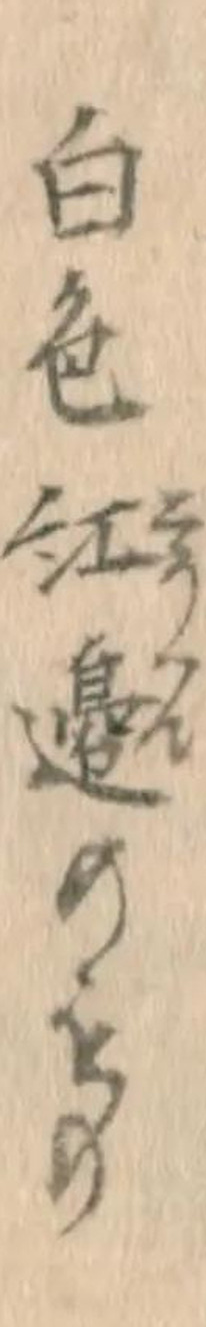白色紅辺のもの
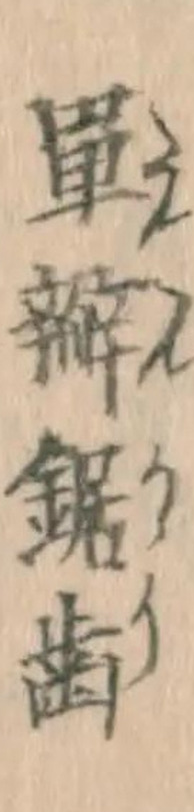単弁鋸歯
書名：本草図譜. 巻40-42
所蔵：国立国会図書館 National Diet Library, JAPAN
